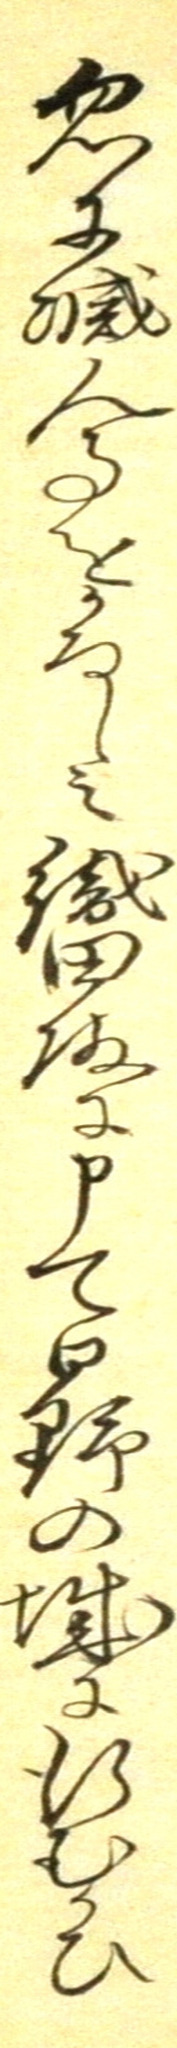衆に滅ん事をかなしみ織田殿に申て日野の城に行むかひ
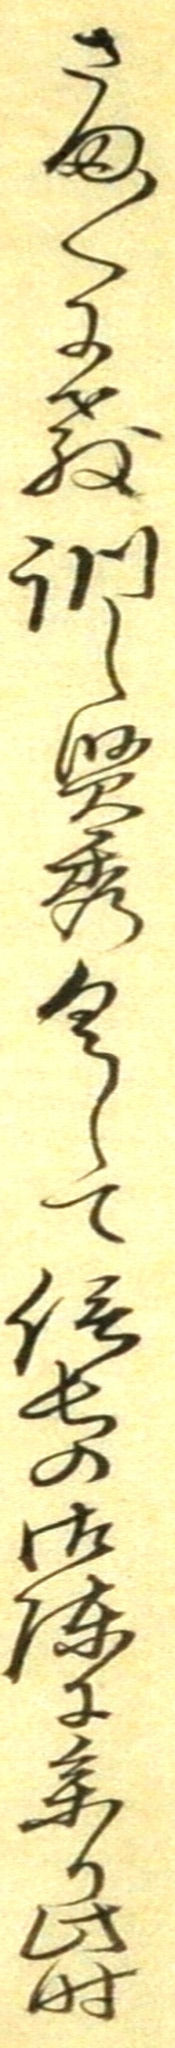さま〳〵に教訓し賢秀くして信長の御陣に参り此時
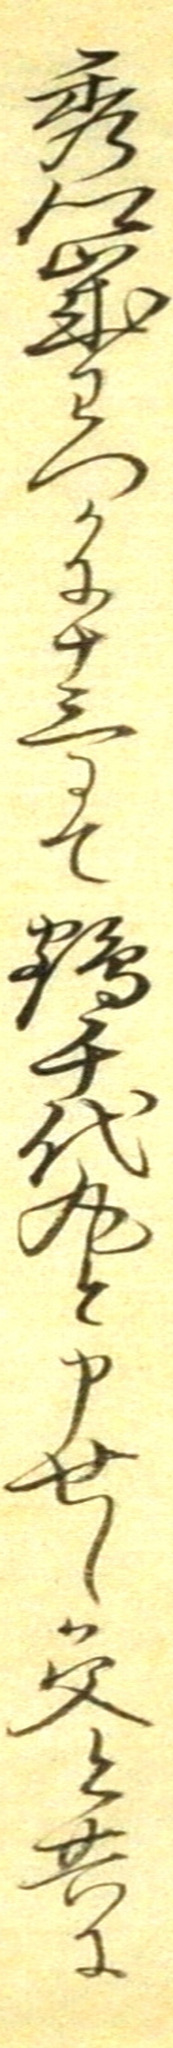秀郷歳わつかに十三にて鶴千代丸と申せしか父と共に
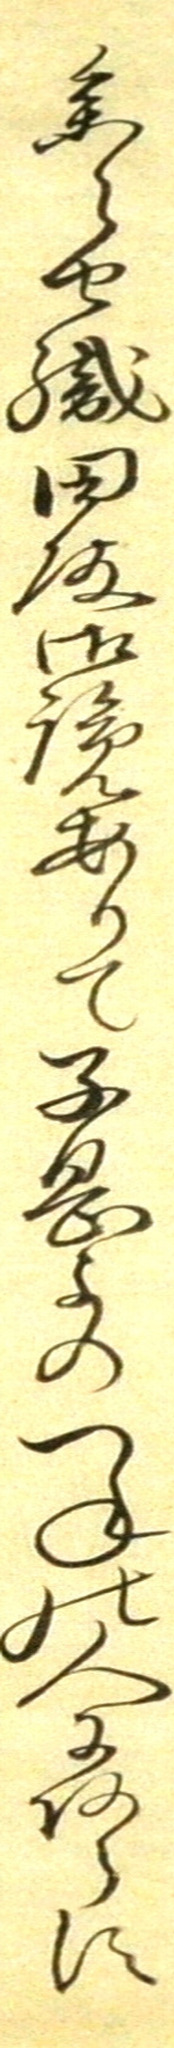参ららせ織田殿御讒ありて子息よのつねの人にあらす
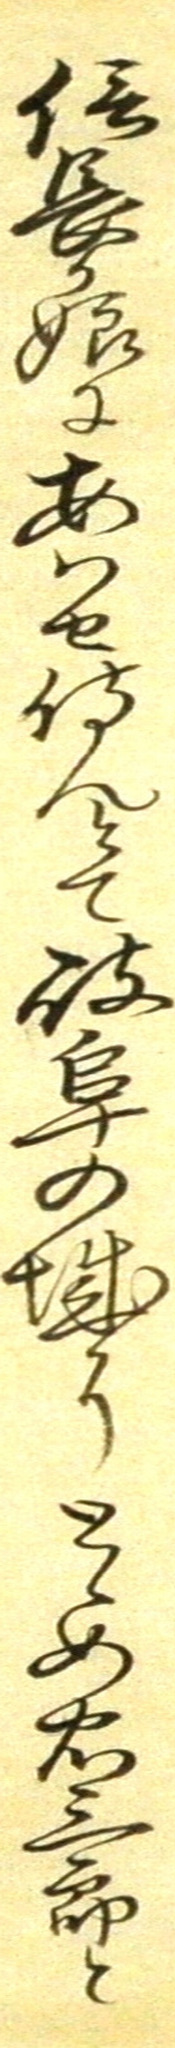信長か娘にあはせ侍んとて岐阜の城にとゝめ忠三郎と
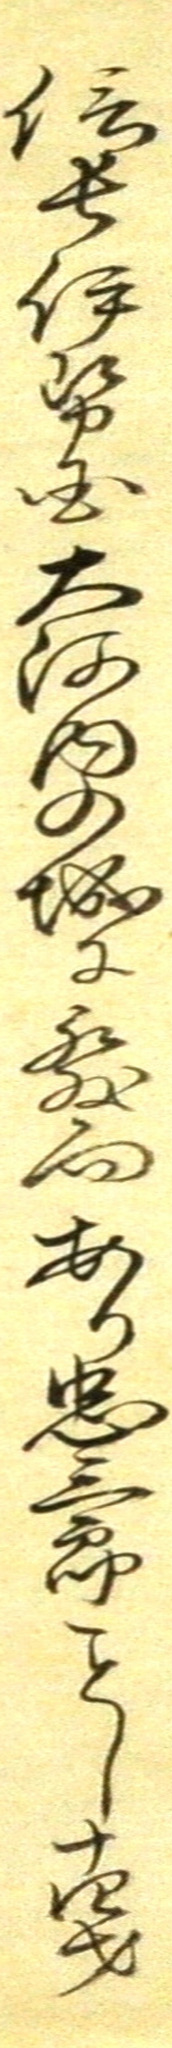信長伊勢国大河内の城に発向あり忠三郎ことし十四才
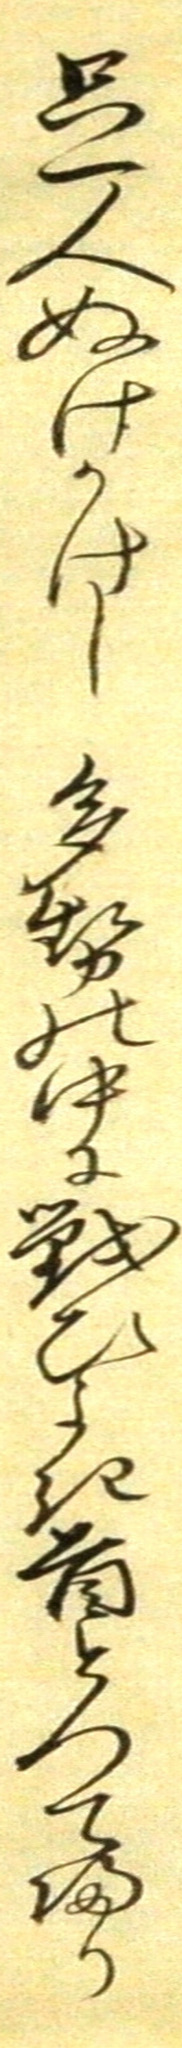只一人ぬけかけし多勢の中に戦ひよき首とつて帰り
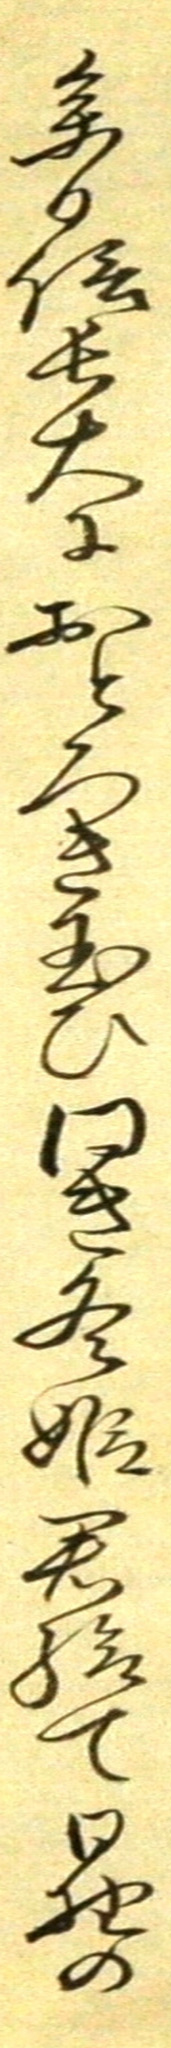参る信長大におとろき玉ひ同き冬姫君給て日野の
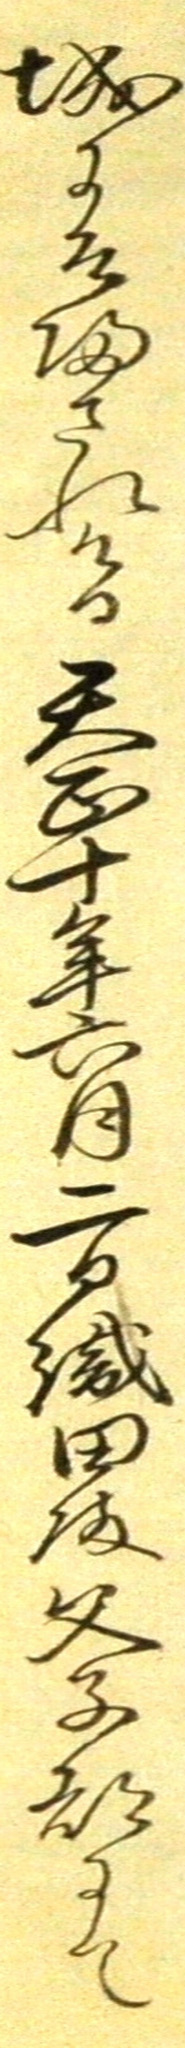城には帰されける天正十年六月二日織田父子都にて
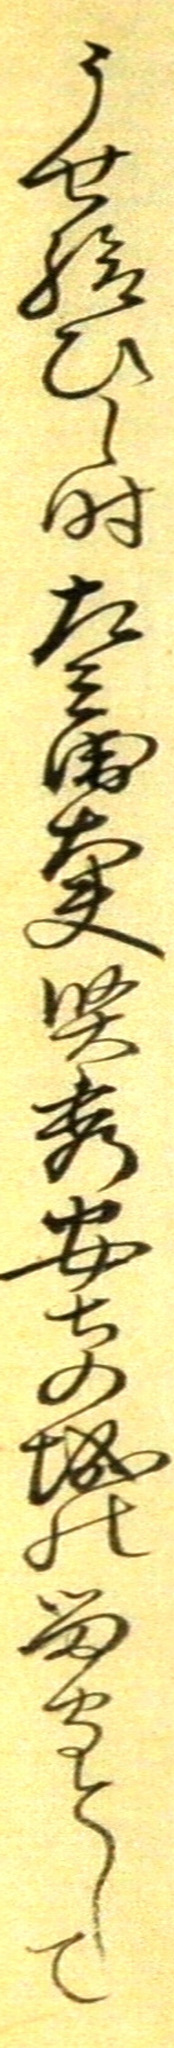うせ給ひし時左兵衛大夫賢秀安土の城の留守として

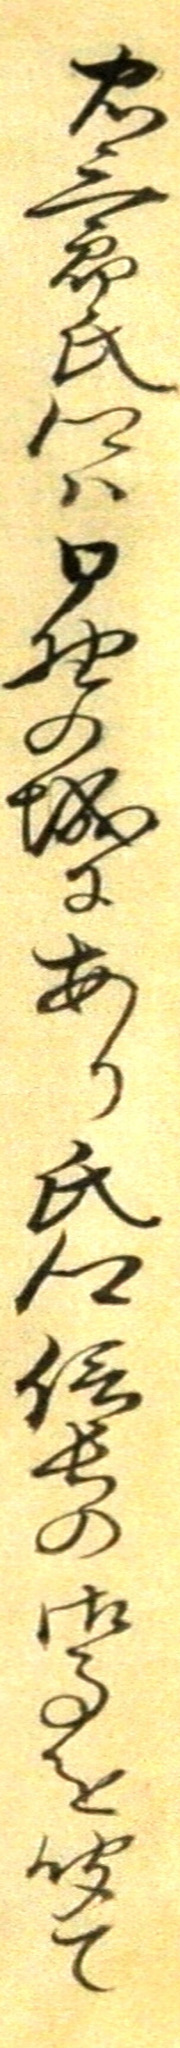忠三郎氏郷は日野の城にあり氏郷信長の御事を聞て
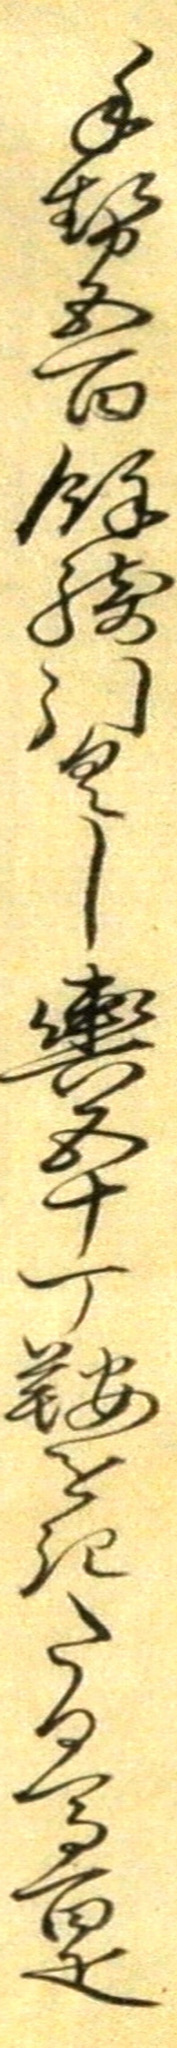手勢五百余騎引具し輿五十丁鞍をきたる馬百疋
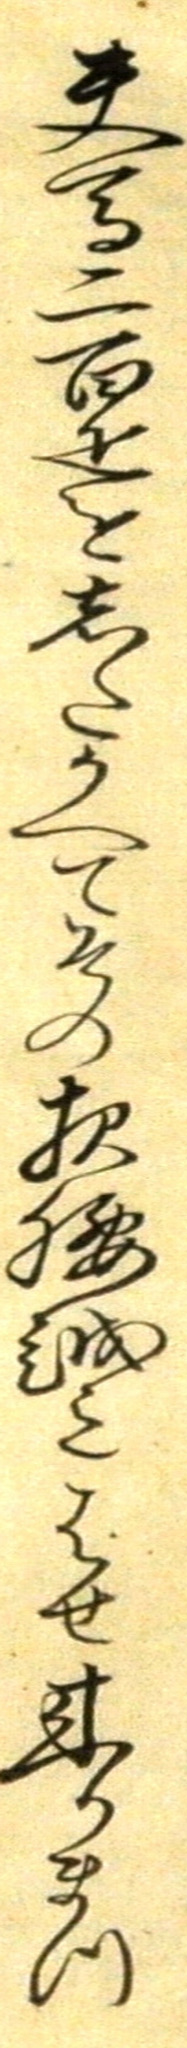夫馬二百疋をしたかへてその夜腰越迄はせ来りまつ
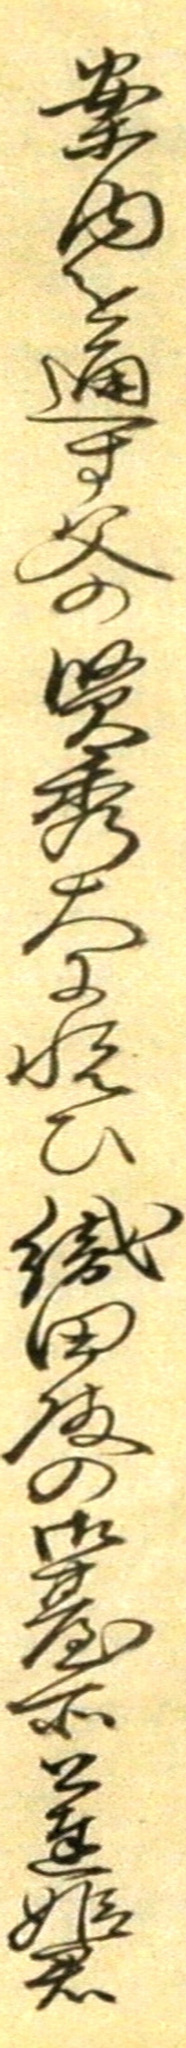案内を通す父の賢秀大に悦ひ織田殿の御台所公達姫君
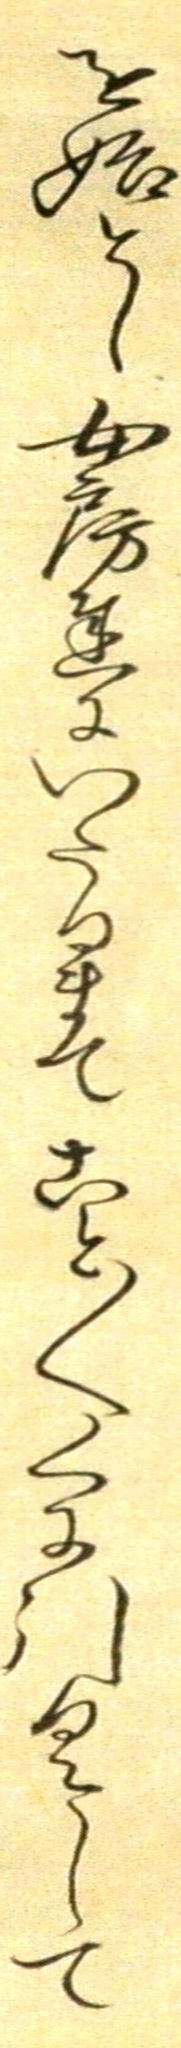を始とし女房達にいたるまてこと〳〵くに引具して
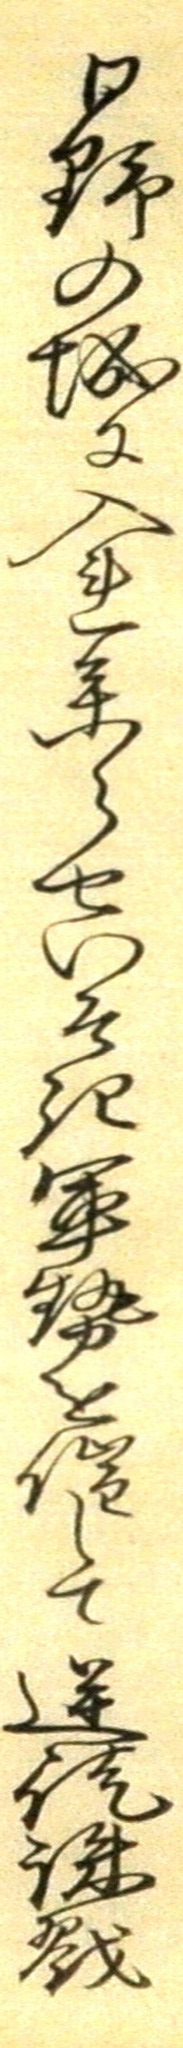日野の城に入れ参らせいそき軍勢を催して遂徒誅戮
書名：藩翰譜（十二・上）
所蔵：伊那市立高遠町図書館・合同会社AMANE
